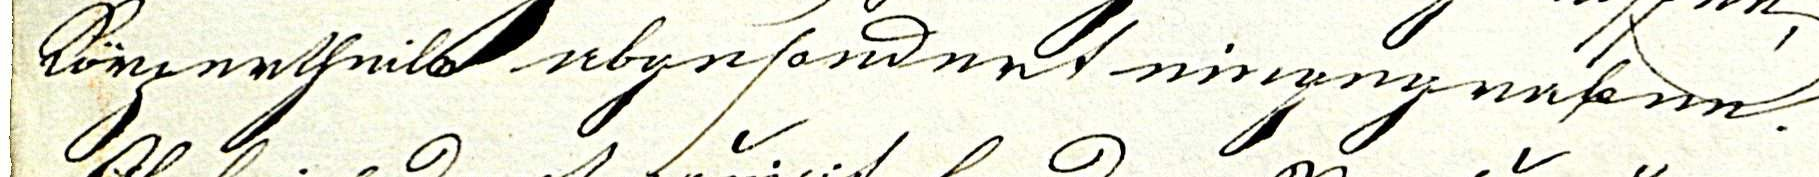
Körpertheile abgesondert eingegraben.
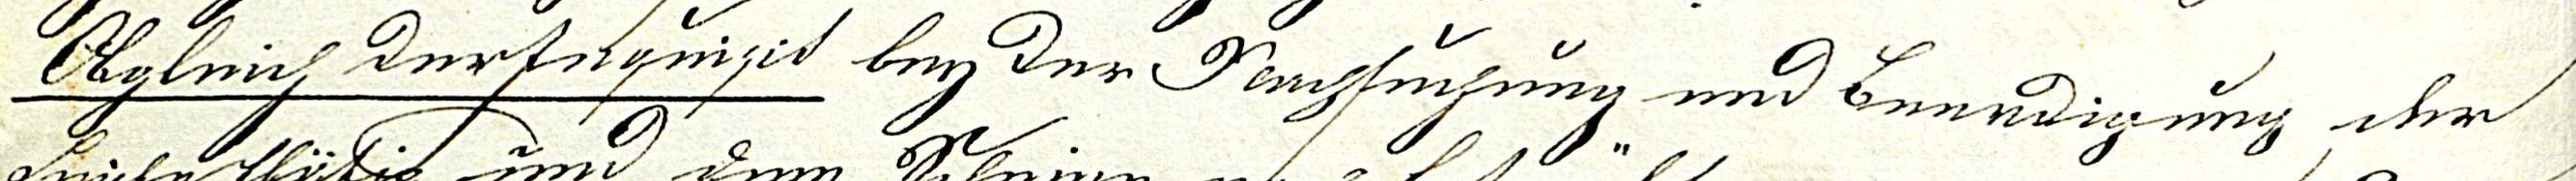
Obgleich der Inquisit bey der Nachsuchung und Beerdigung der
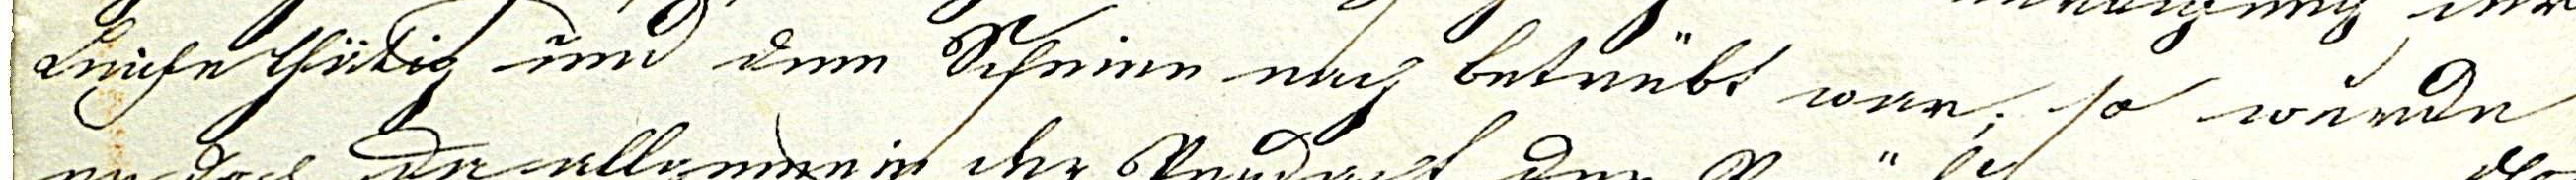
Leiche thätig und dem Scheine nach betrübt war, so wurde
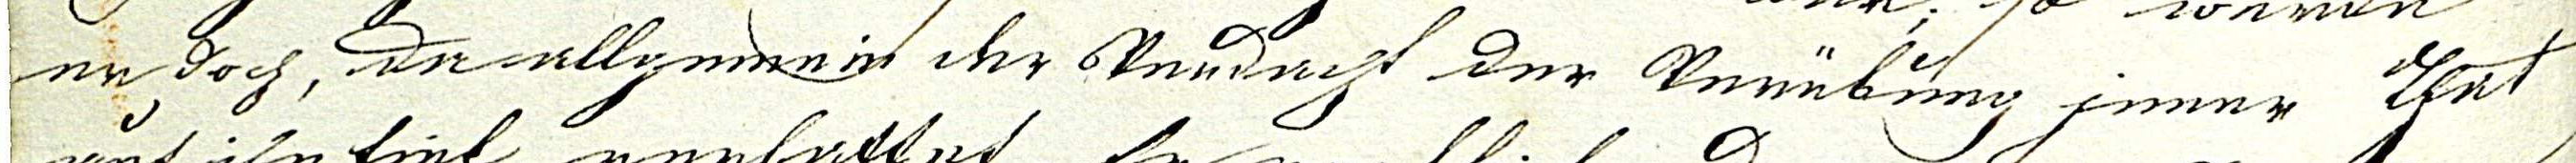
er doch, da allgemein der Verdacht der Verübung jener That
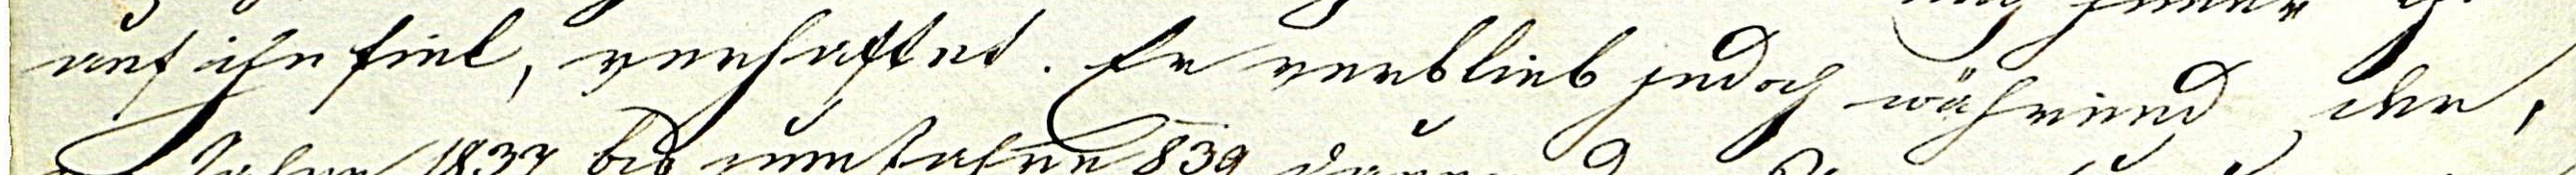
auf ihn fiel, verhaftet. Er verblieb jedoch während der,
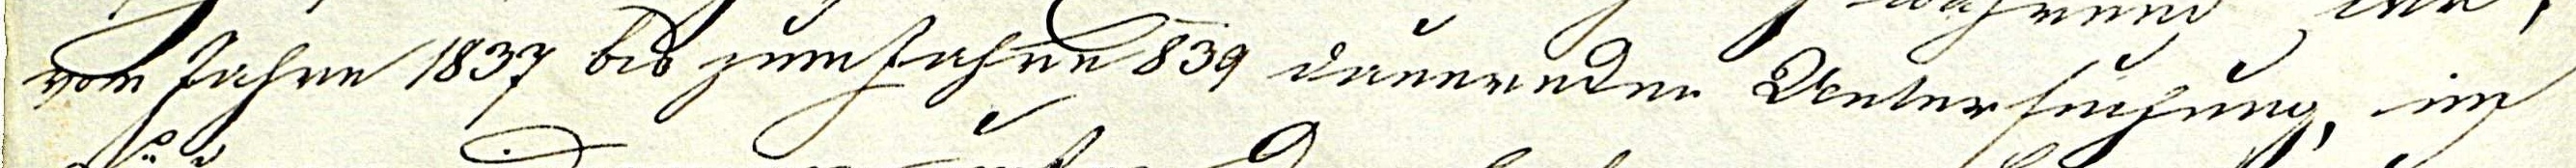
vom Jahre 1837 bis zum Jahre 1839 dauernden Untersuchung, im
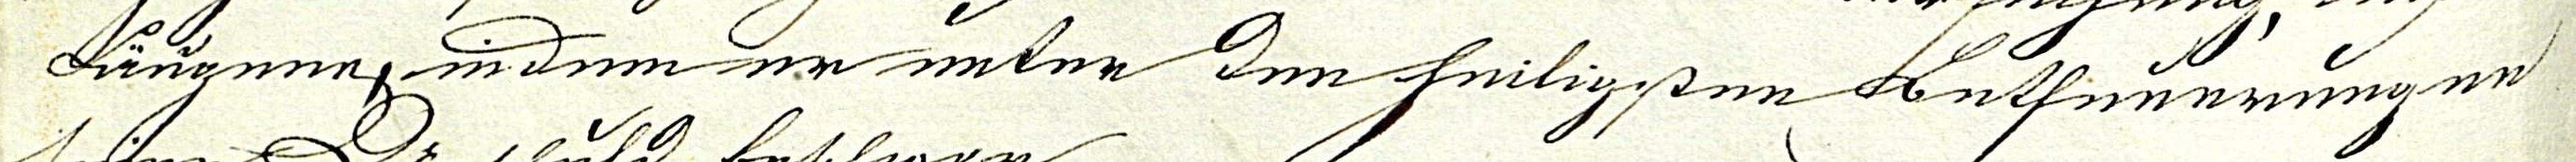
Läugnen, in dem er unter den heiligsten Betheuerungen
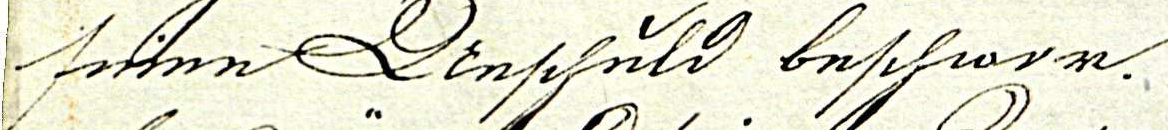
seine Unschuld beschwor.
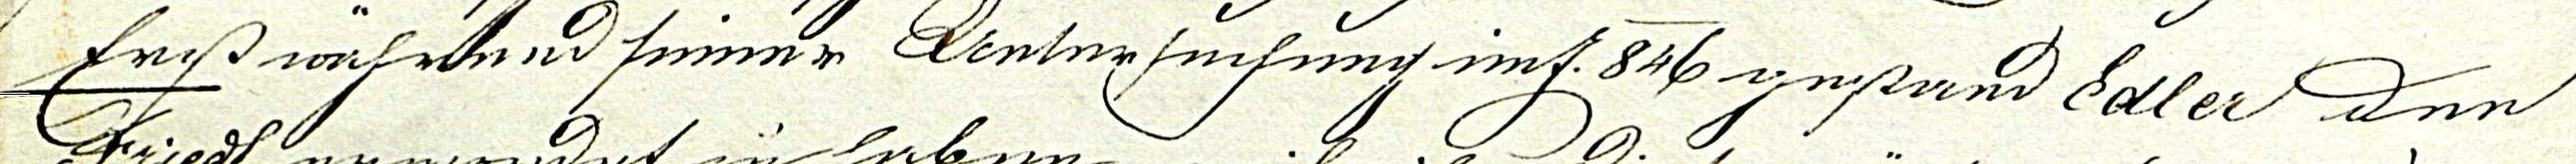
Erst während seiner Untersuchung im J. 846 gestand Edler den
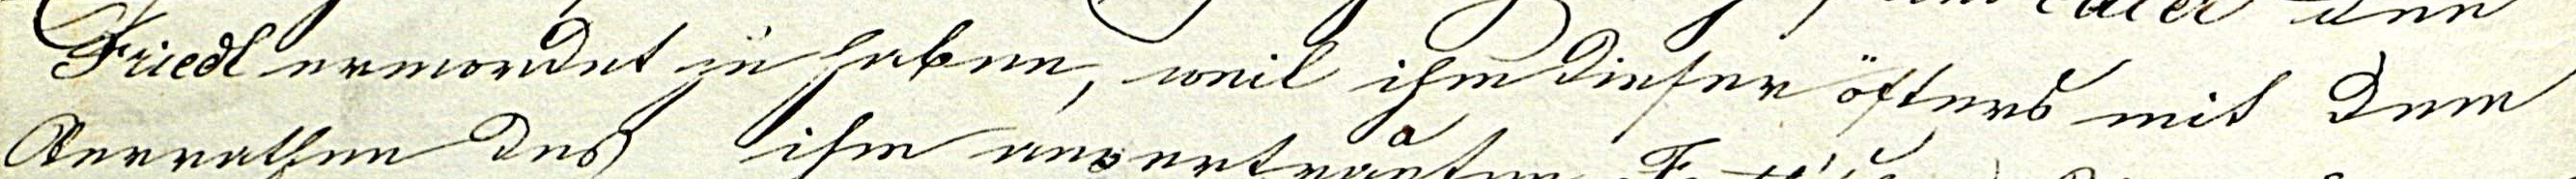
Frield ermordet zu haben, weil ihm dieser öfters mit dem
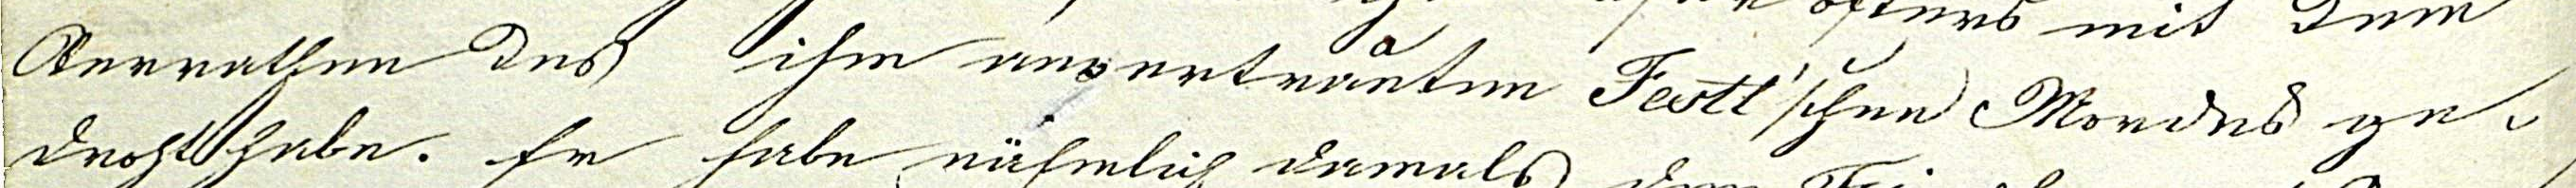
Verrathen des ihm anvertrauten Festl’schen Mordes ge¬
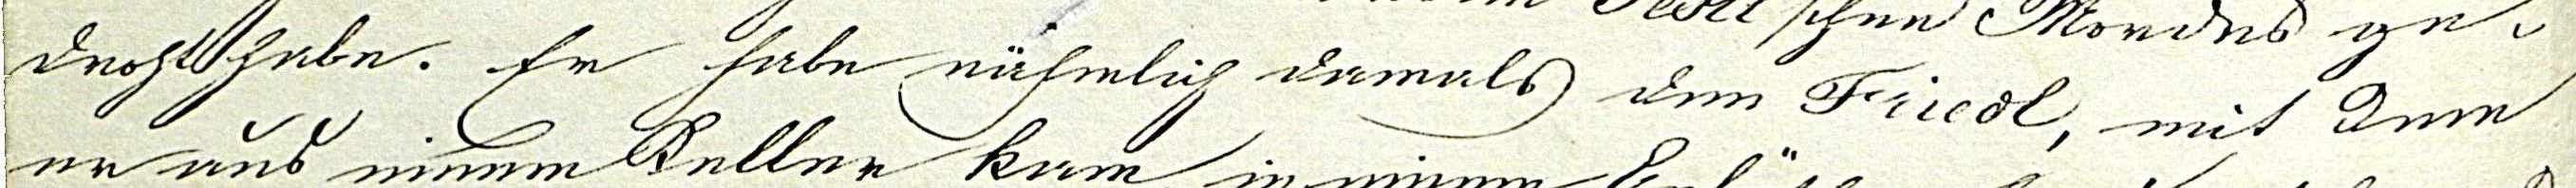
droht habe. Er habe nähmlich damals dem Friedl, mit dem
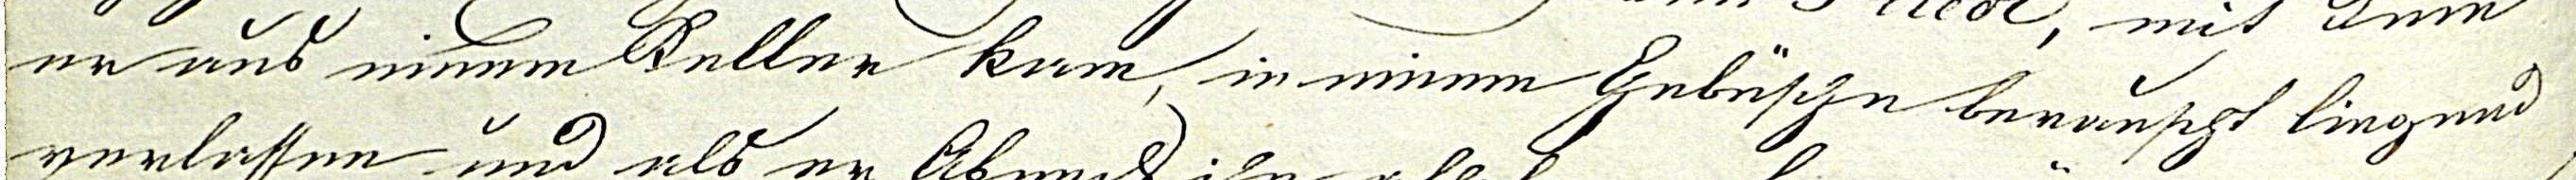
er aus einem Keller kam, in einem Gebüsche berauscht liegend
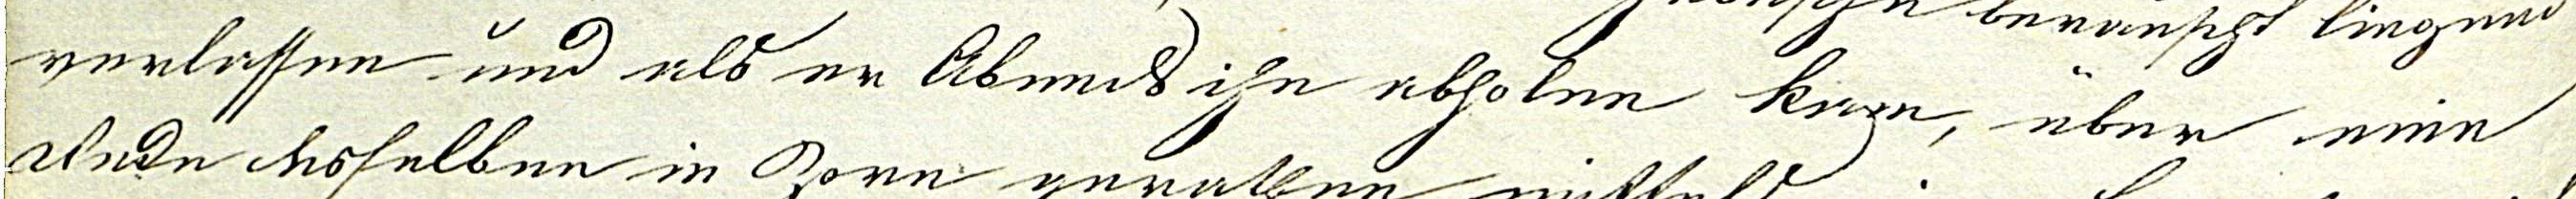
verlassen und as er Abends ihn abholen kam, über eine
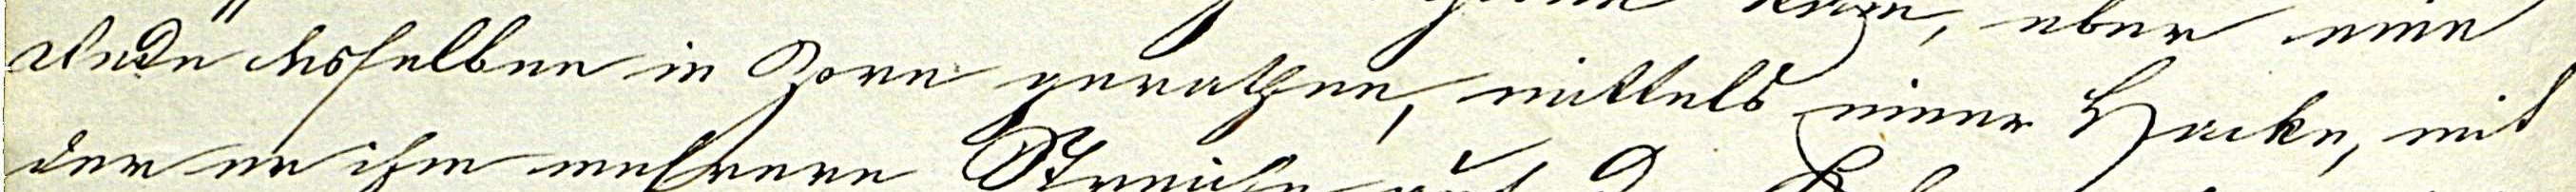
Rede desselben in Zorn gerathen, mittels einer Hacke, mit
